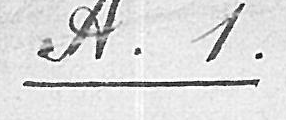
A. 1.
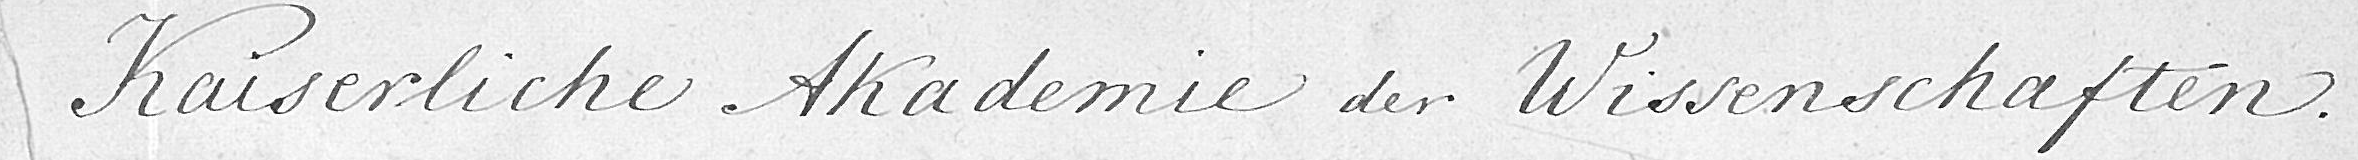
Kaiserliche Akademie der Wissenschaften.
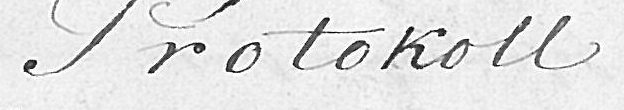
Protokoll
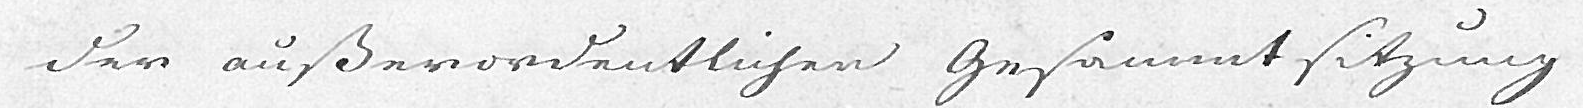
der außerordentlichen Gesammtsitzung
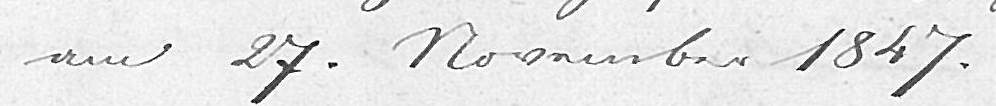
am 27. November 1847
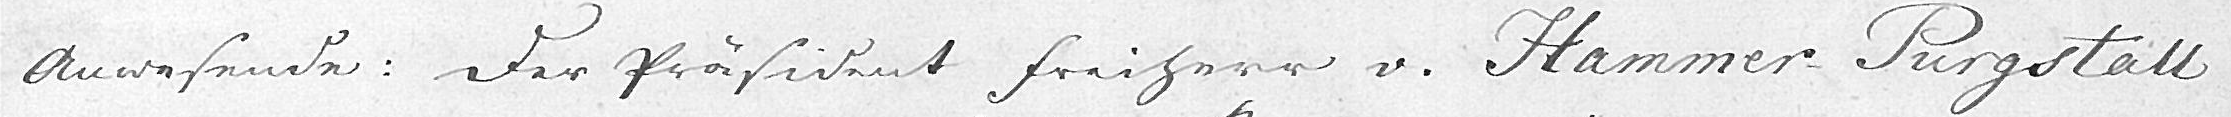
Anwesende: der Präsident Freiherr v. Hammer-Purgstall
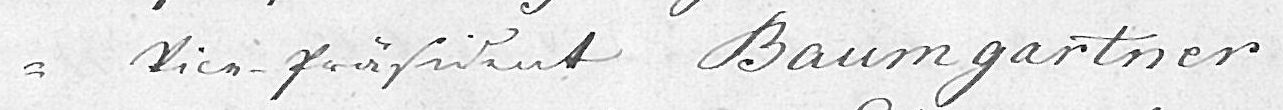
" Vice-Präsident Baumgartner
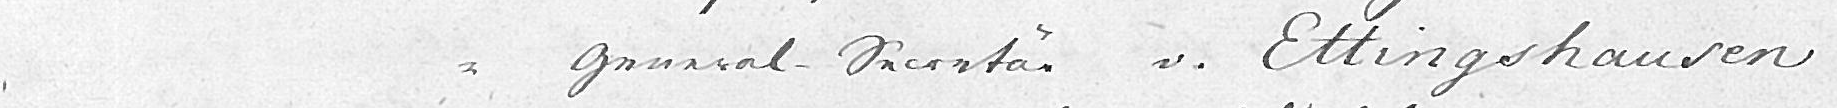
" General-Secretär v. Ettingshausen
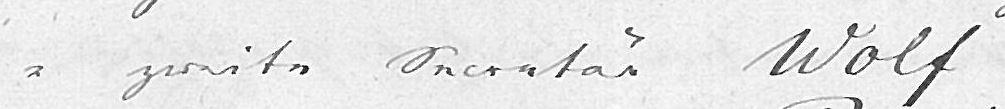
" zweite Secretär Wolf
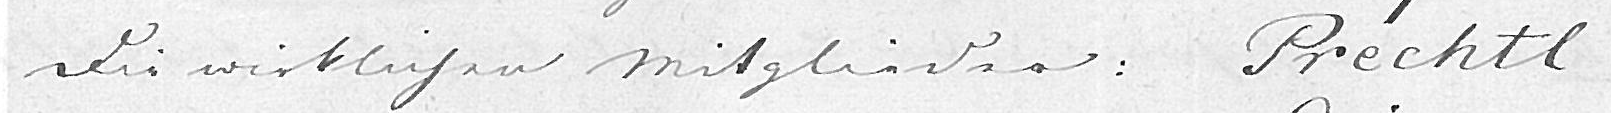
die wirklichen Mitglieder Precht
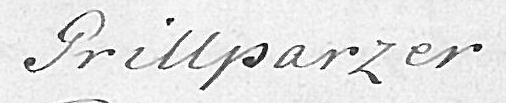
Grillparzer
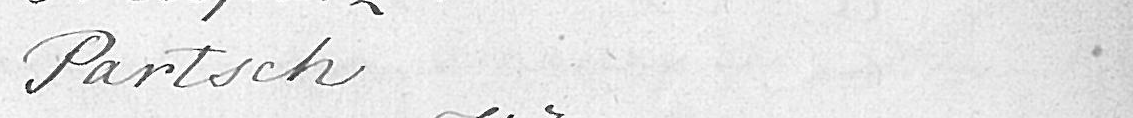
Partsch
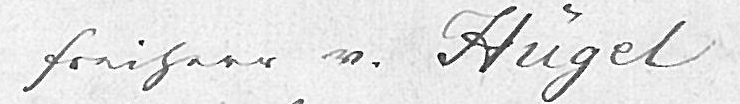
Freiherr v. Hügel
